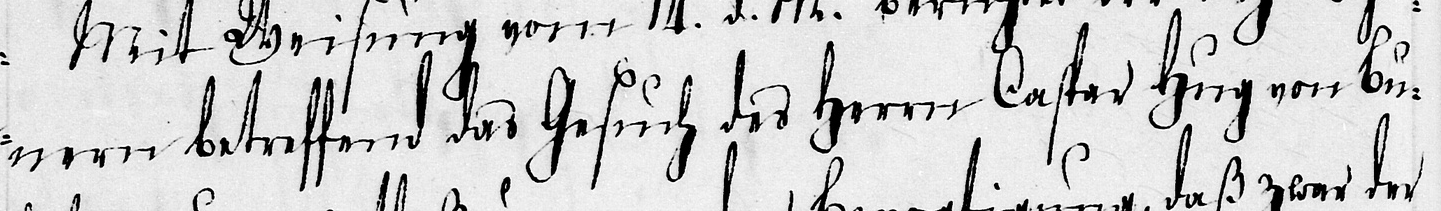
nern betreffend das Gesuch des Herrn Caspar Hug von Bu¬
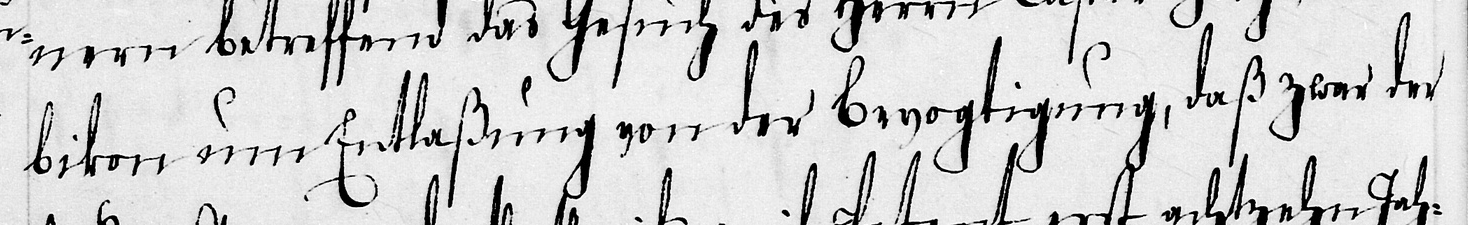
bikon um Entlaßung von der Bevogtigung, daß zwar der
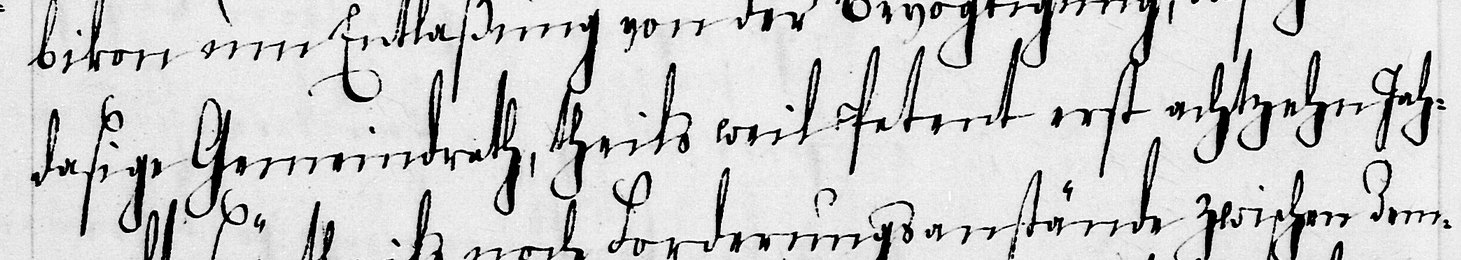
dasige Gemeindrath, theils weil Petent erst achtzehn Jah¬
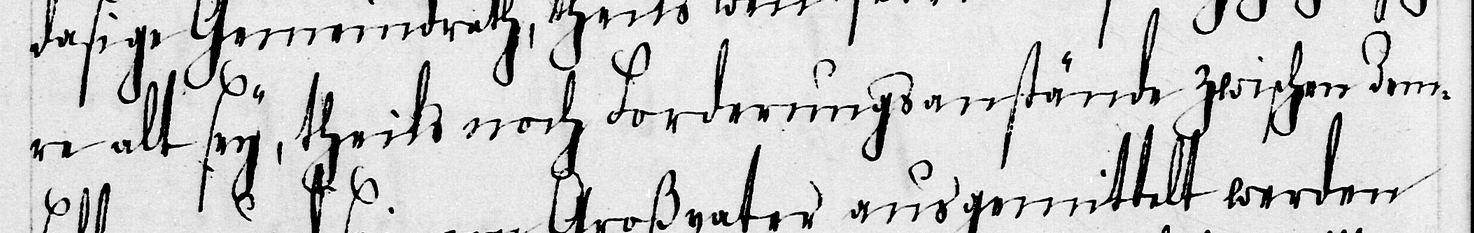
re alt sey, theils noch Forderungsanstände zwischen dem¬
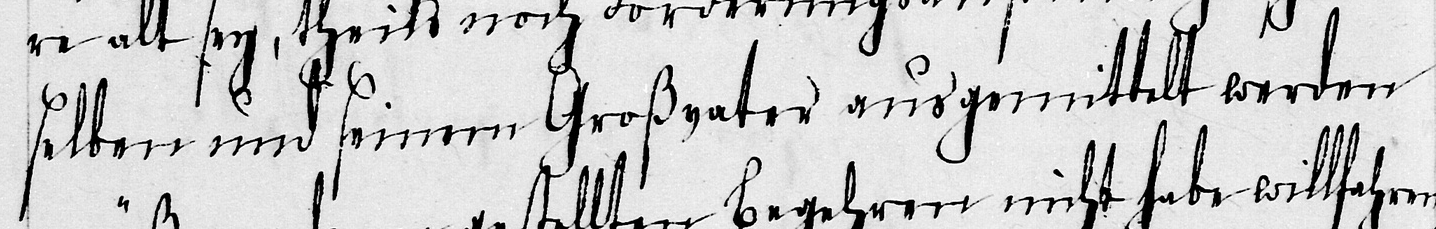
selben und seinem Großvater ausgemittelt werden
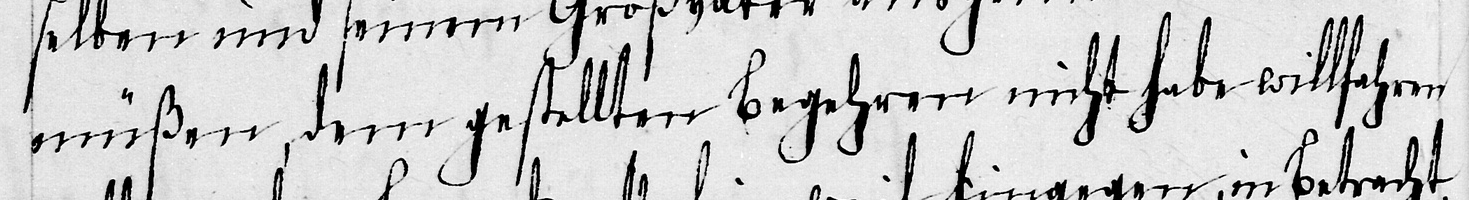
müßen, dem gestellten Begehren nicht habe willfahren
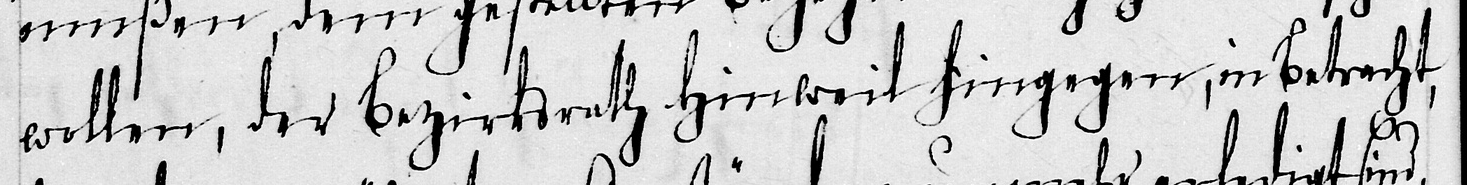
wollen, der Bezirksrath Hinweil hingegen, in Betracht,
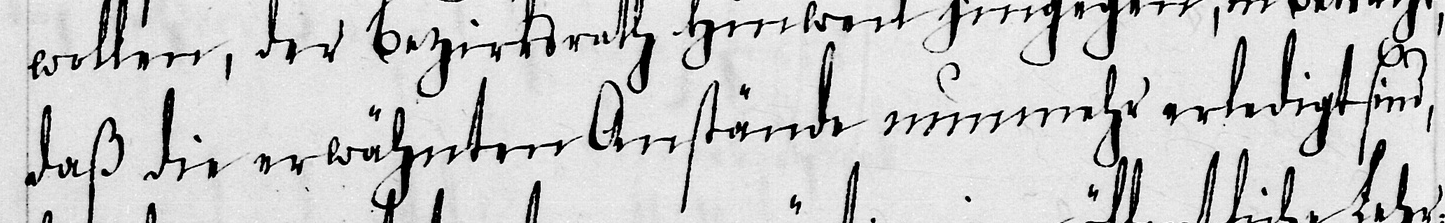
daß die erwähnten Anstände nunmehr erledigt sind,
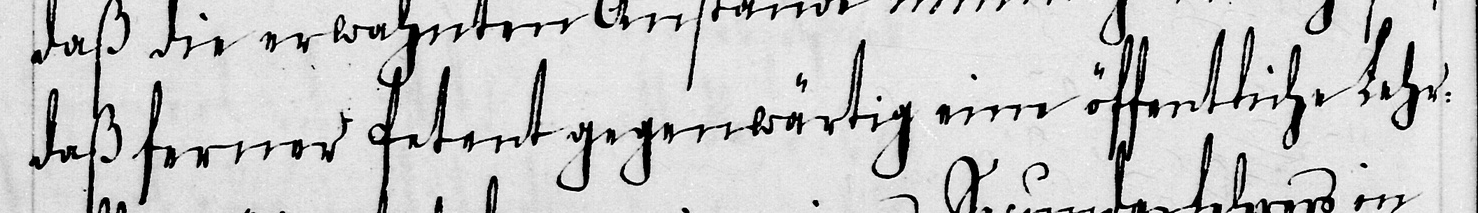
daß ferner Petent gegenwärtig eine öffentliche Lehr¬
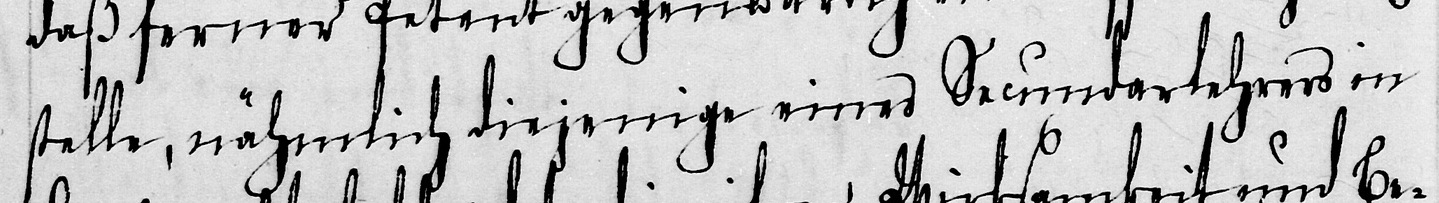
stelle, nämlich diejenige eines Secundarlehrers in
